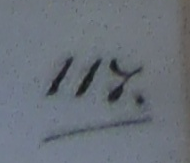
117.
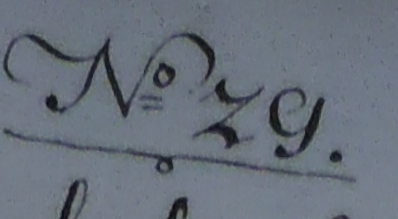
No͇ 29.
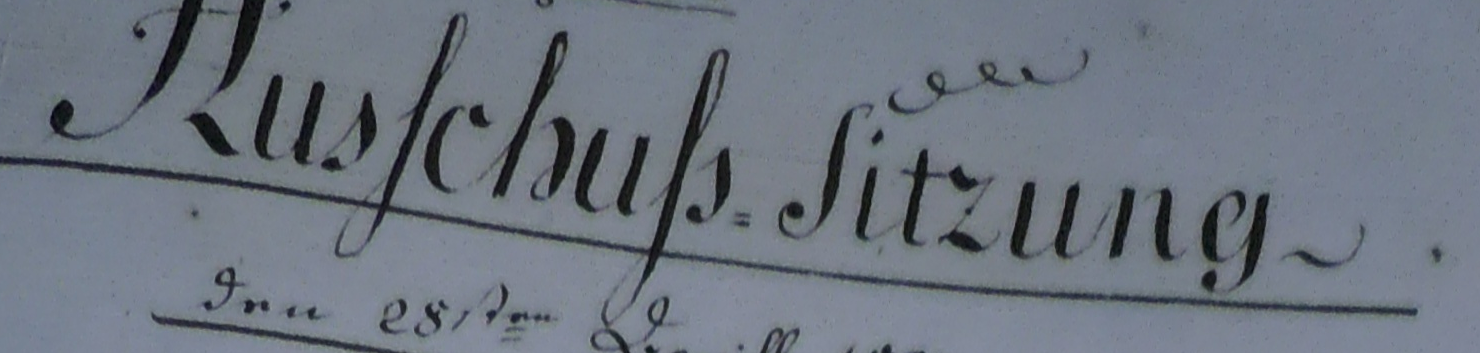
Ausschuss=Sitzung
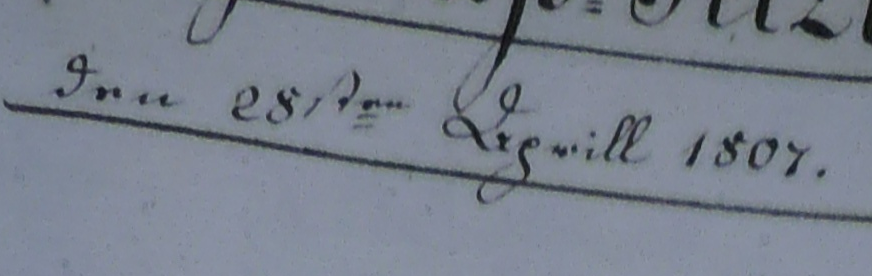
den 28ste͇n Aprill 1807.
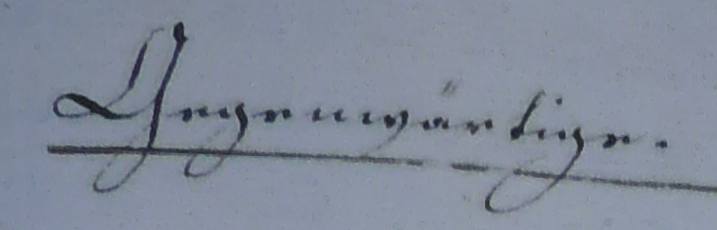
Gegenwärtige.
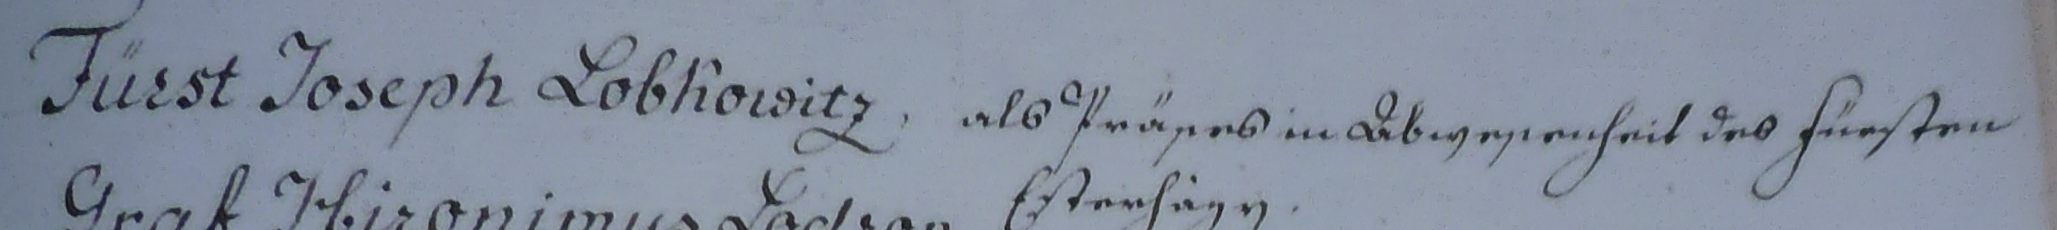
Fürst Joseph Lobkowitz, als Präses in Abwesencheit des Fürsten
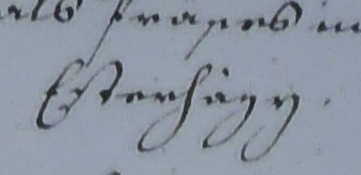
Esterhazy
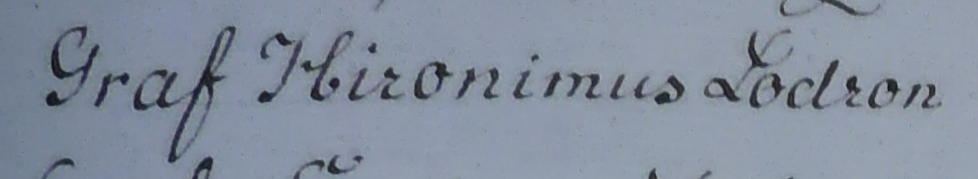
Graf Hironimus Lodron
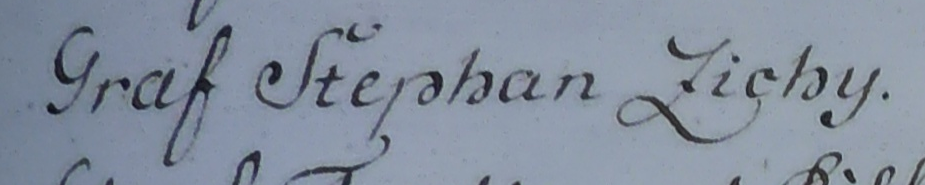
Graf Stephan Zichy.
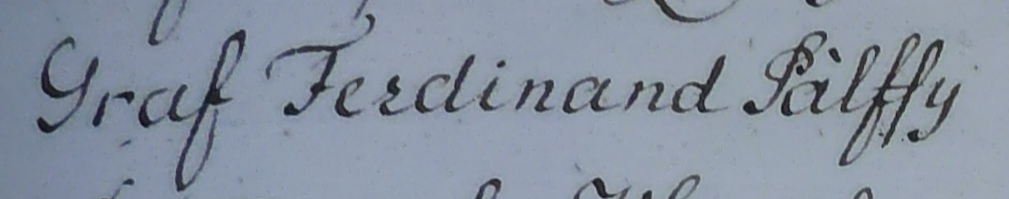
Graf Ferdinand Pàlffy
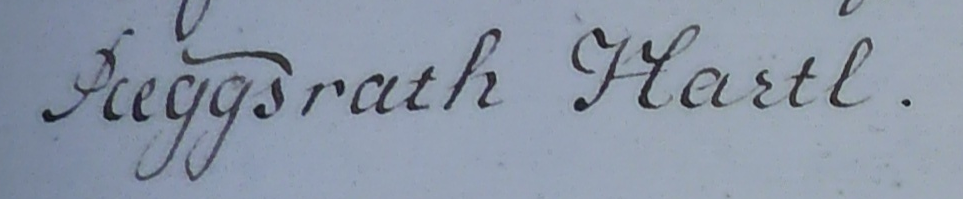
Reg͞gsrath Hartl.
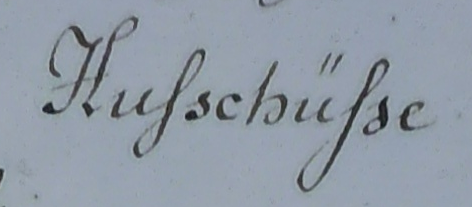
Ausschüsse
